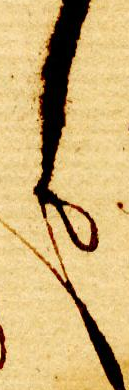To
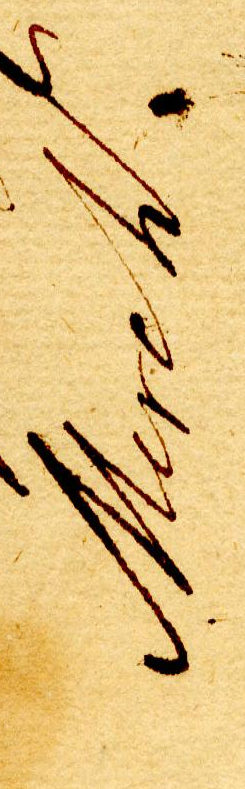Merch^t
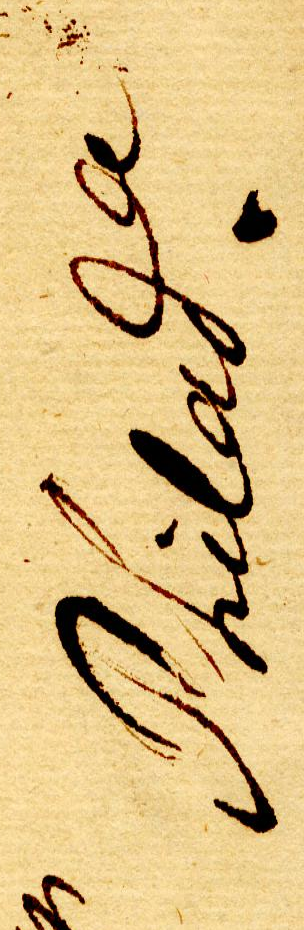Phila^a
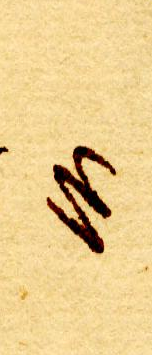In
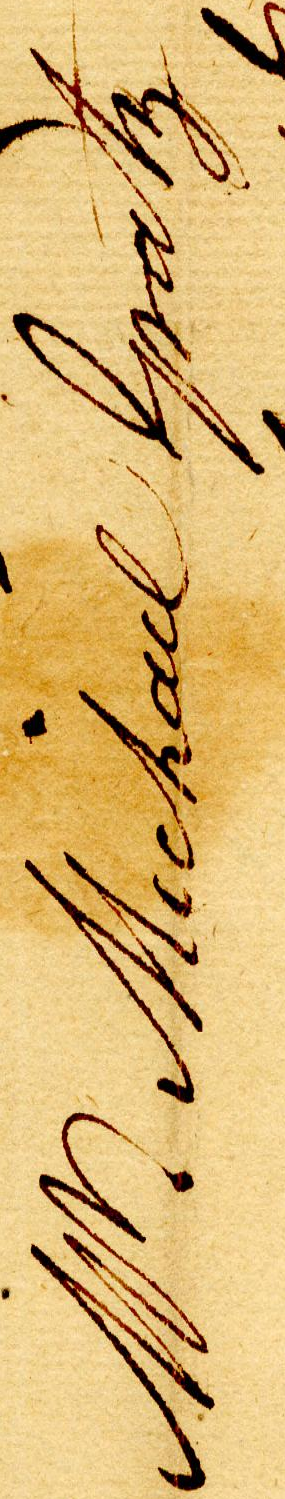M^r Michael Gratz
